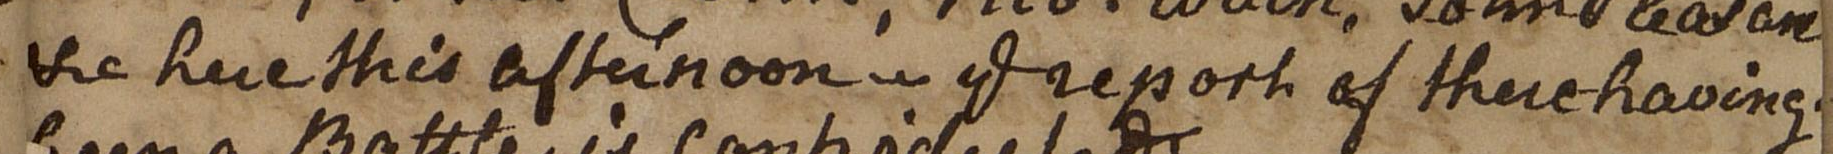&c here this afternoon- y^e report of there having
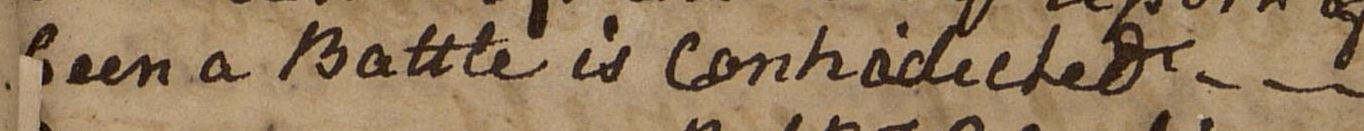been a Battle is Contradicted- -
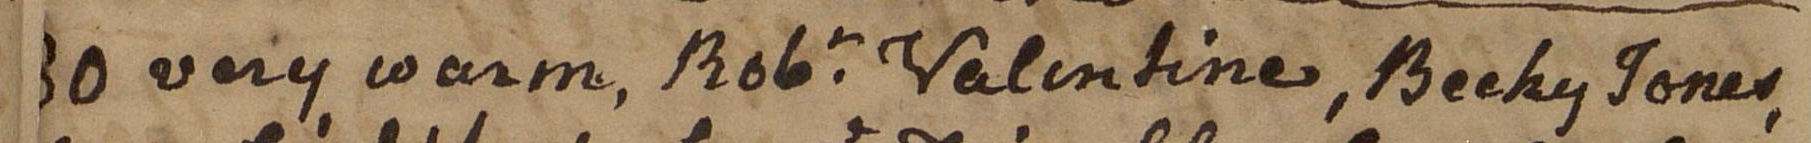[3]0 very warm, Rob^t. Valentine, Becky Jones,
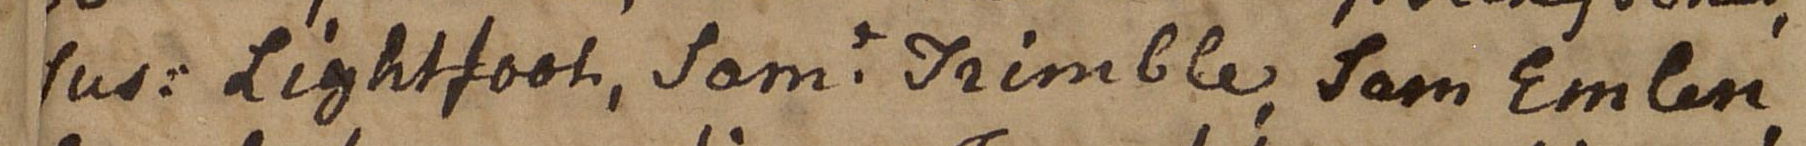[_]us: Lightfoot, Sam^l. Trimble, Sam Emlen,
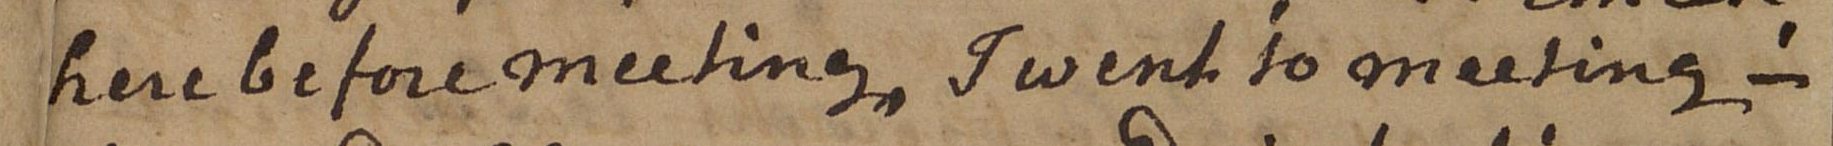here before meeting, I went to meeting-
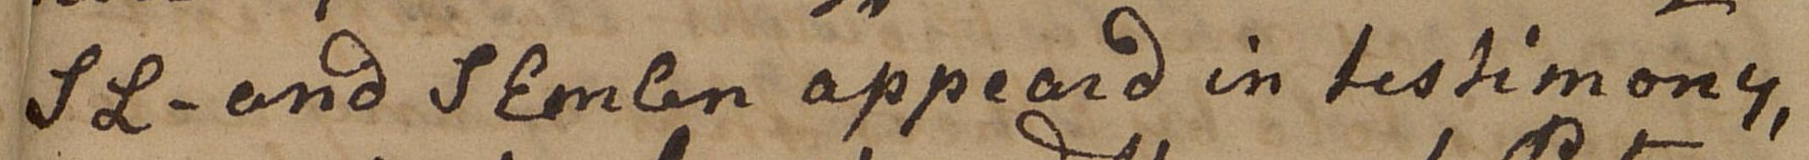SL- and S Emlen appeard in testimony,
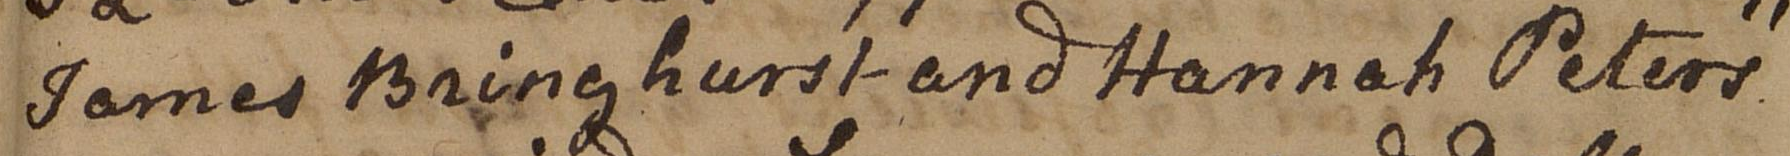James Bringhurst and Hannah Peters
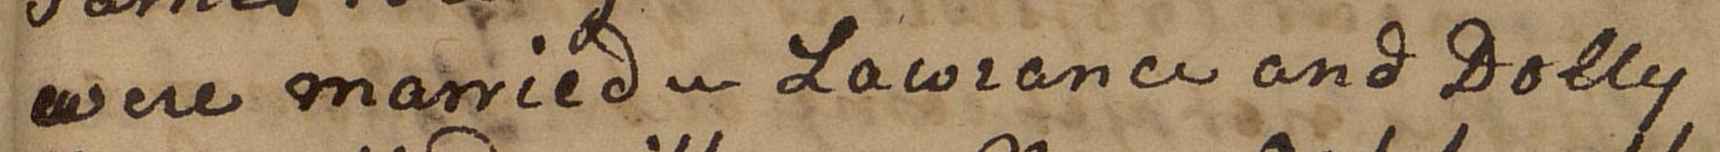were married- Lawrance and Dolly
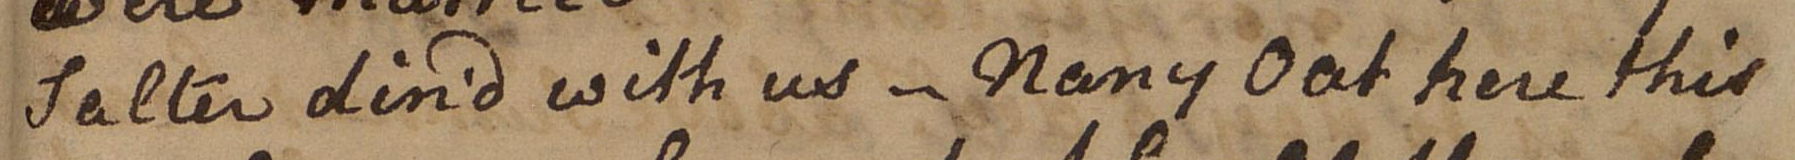Salter din'd with us- Nany Oat here this
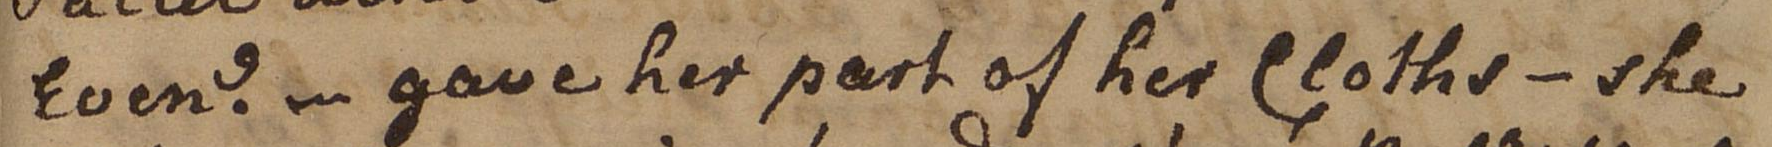even^g.- gave her part of her Cloths- she
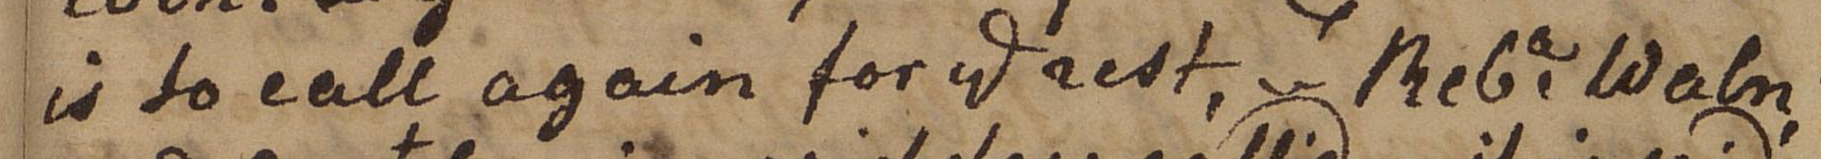is to call again for y^e rest,- Reb^a. Waln
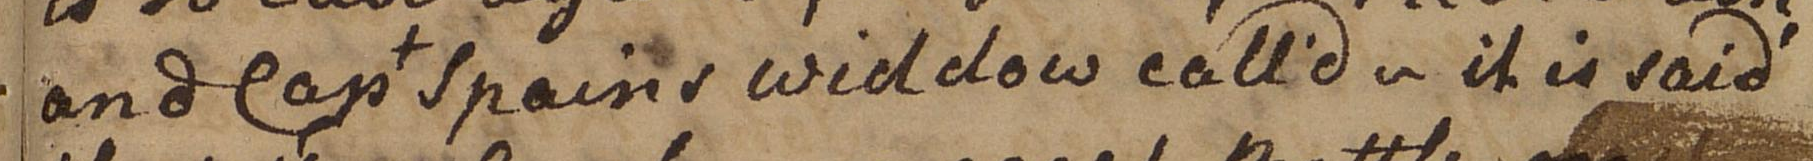and Cap^t Spains Widdow call'd- it is said
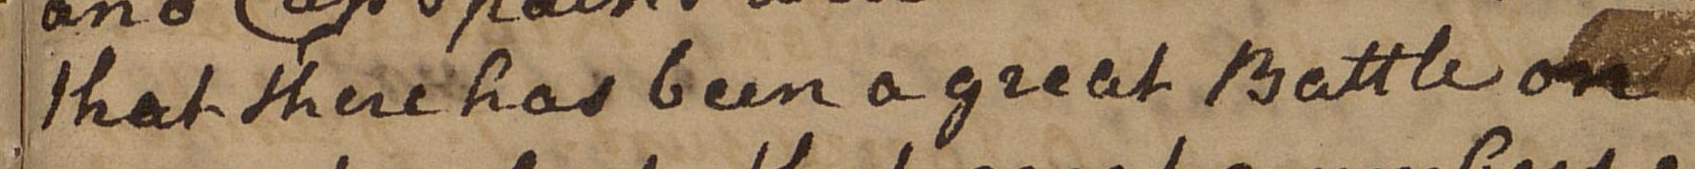that there has been a great Battle on
